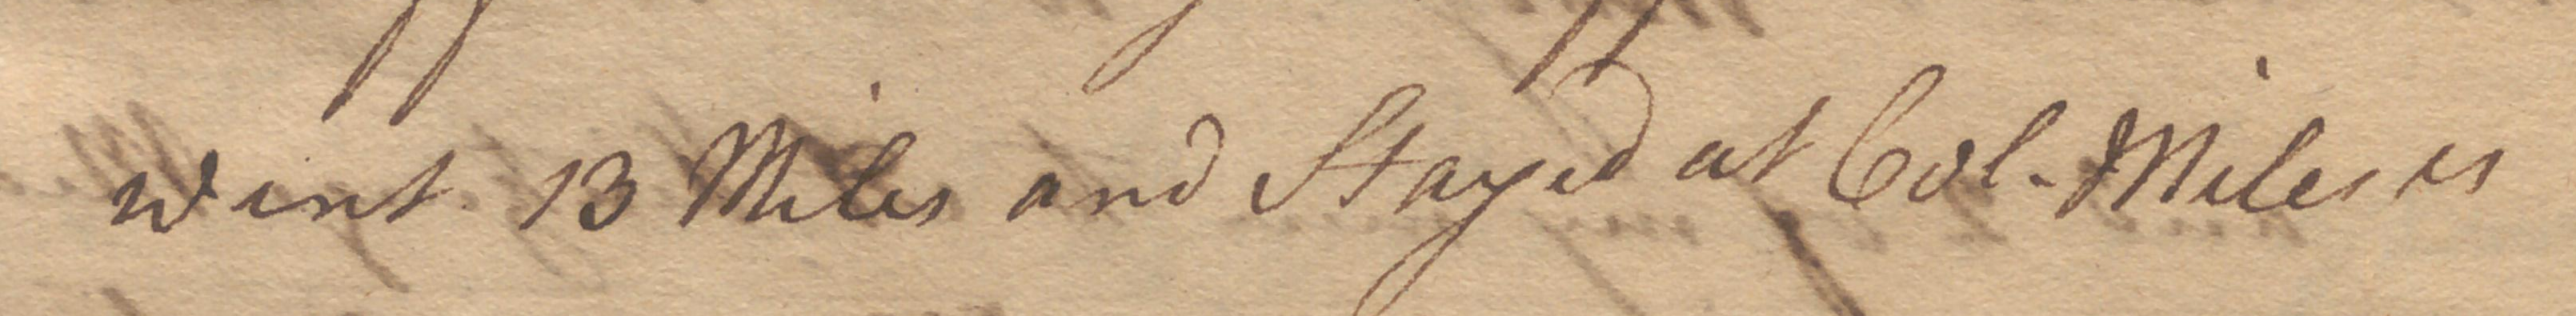went 18 Miles and Stayed at Col. Mileses
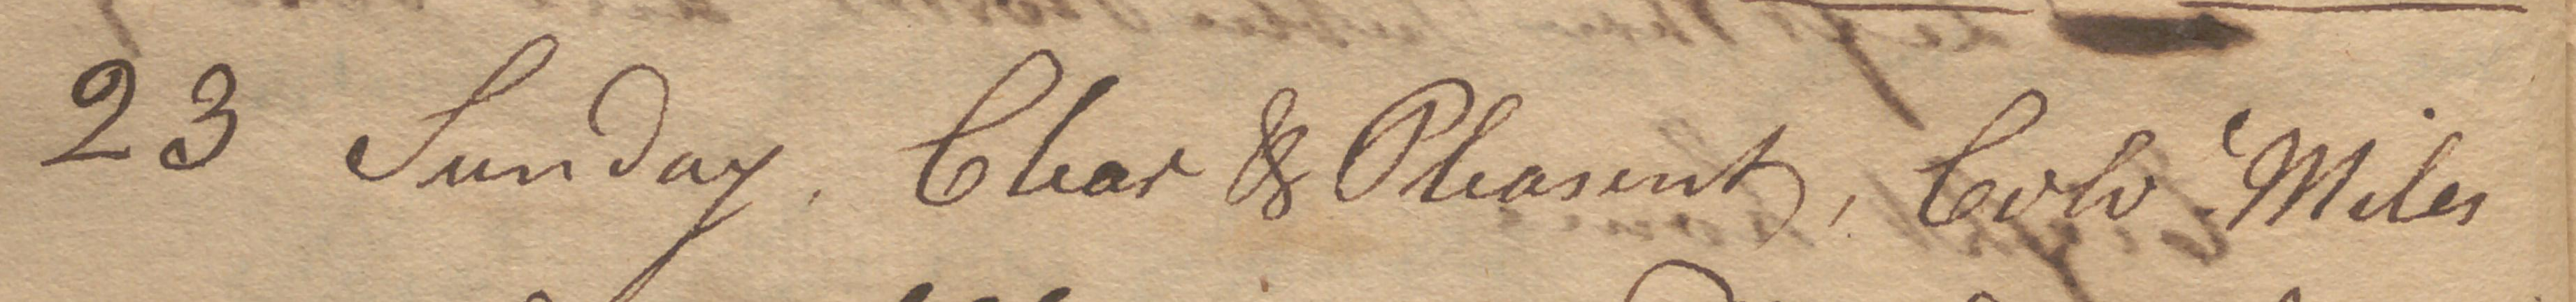23 Sunday, Clear & Pleasent Colo^l. Miles
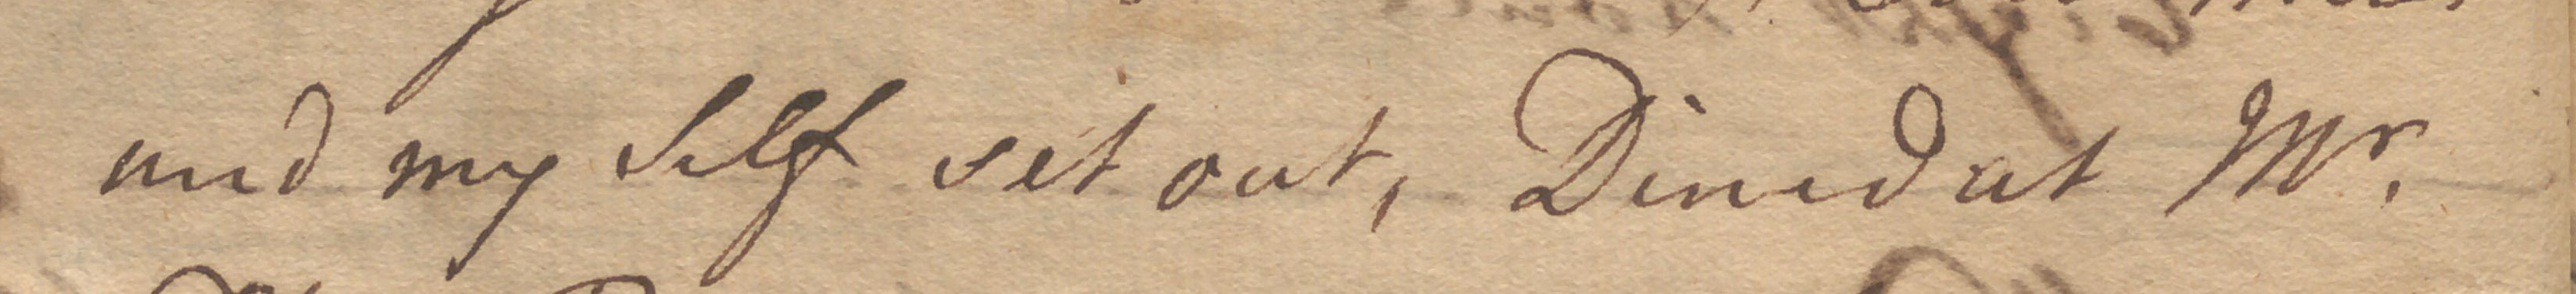and my self set out, Dined at M^r.
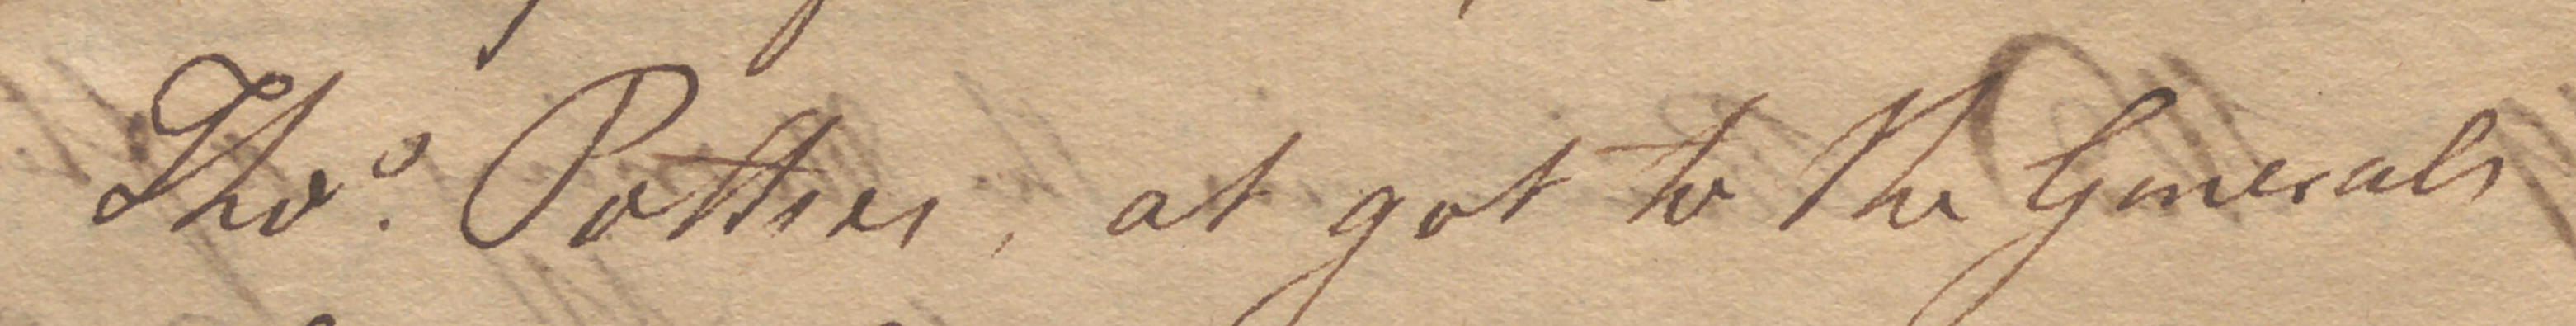Tho^s. Pottses; at got to the Generals
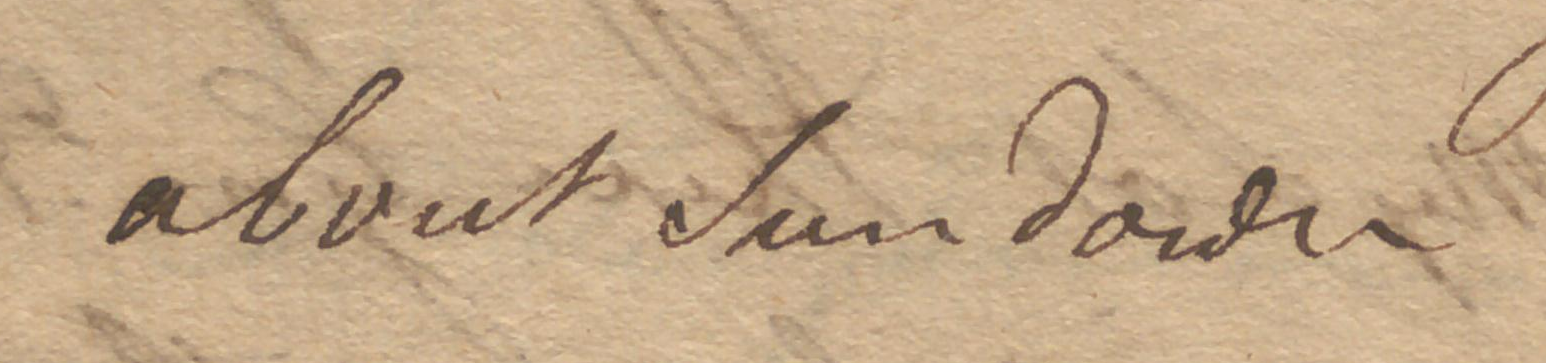about Sundown
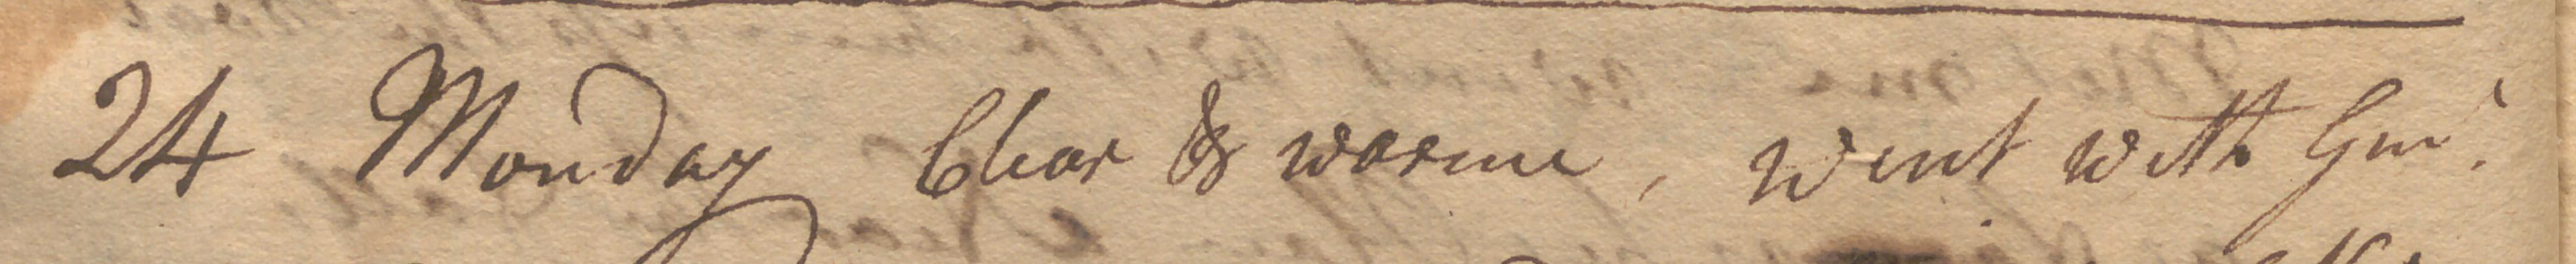24 Monday Clear & warme, went with Gen^l.
